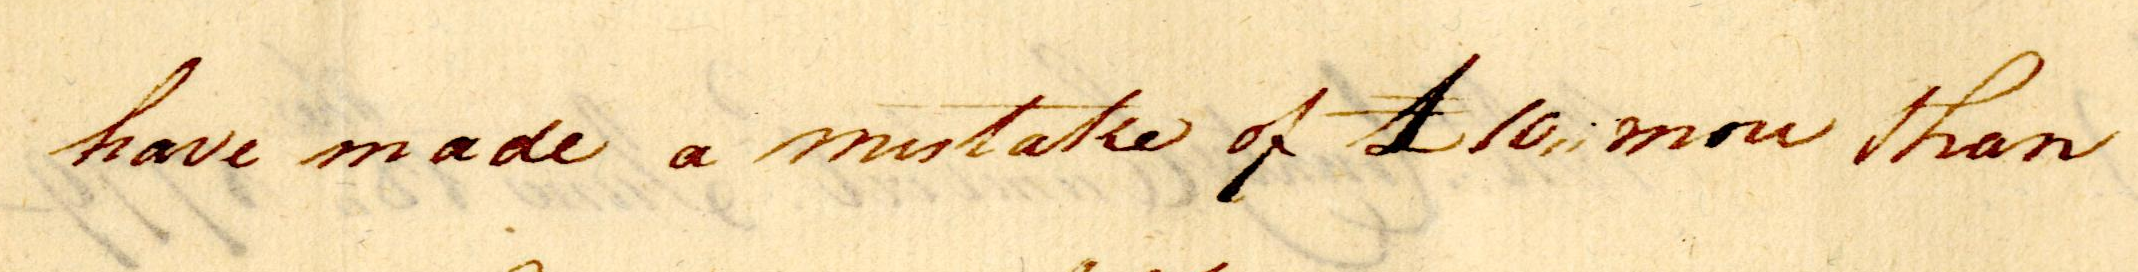have made a mistake of £10, now than
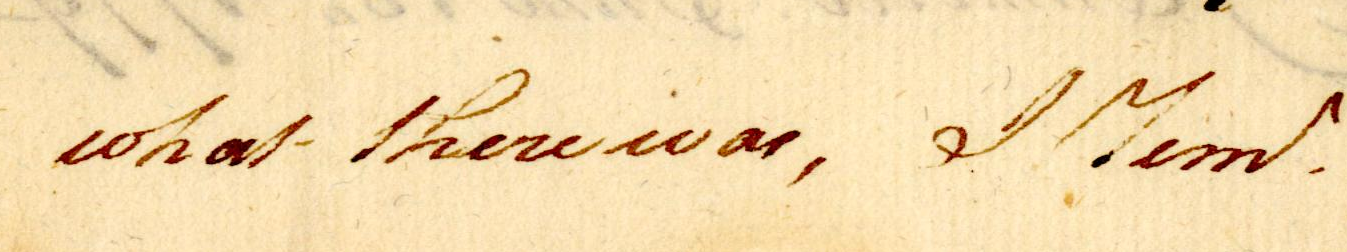what there was, I rem^n.
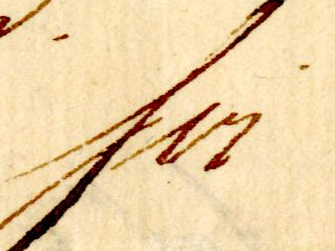Sir
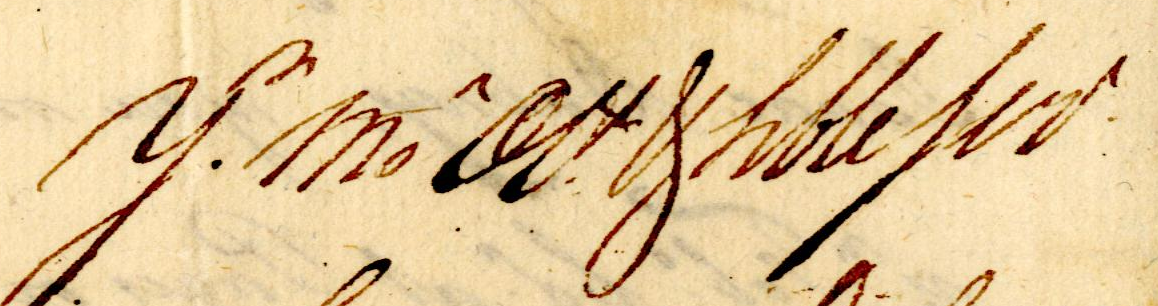Y^r Mo^t Ob^t & hbel Serv^t
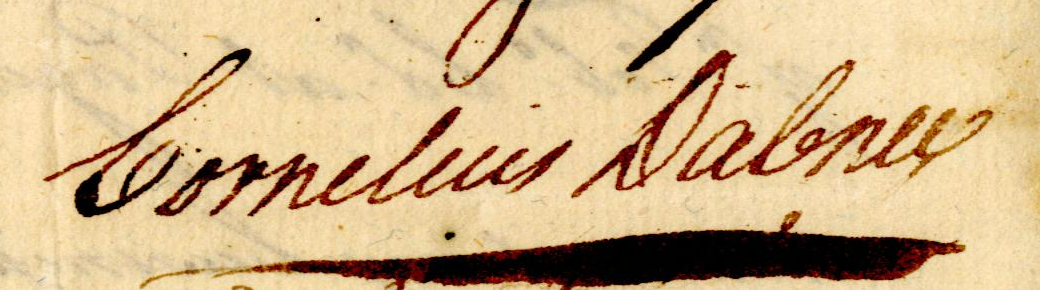Cornelius Dabnee
